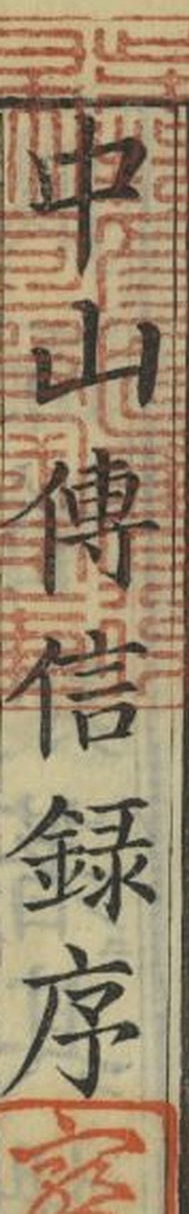中山傳信錄序

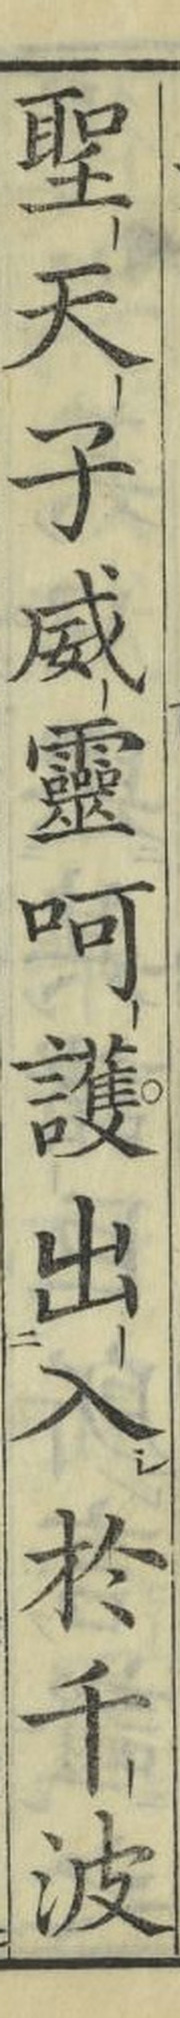聖-天-子威-靈呵-護。出-入扵千-波

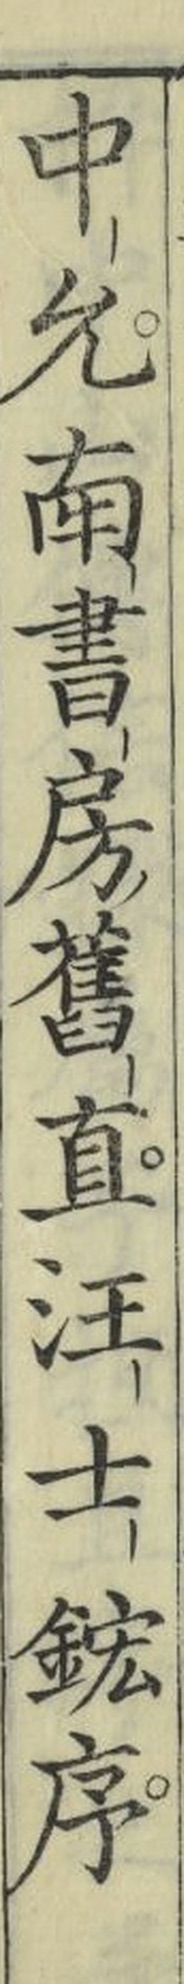中-允。南-書-房舊-直。汪-士-鋐序。

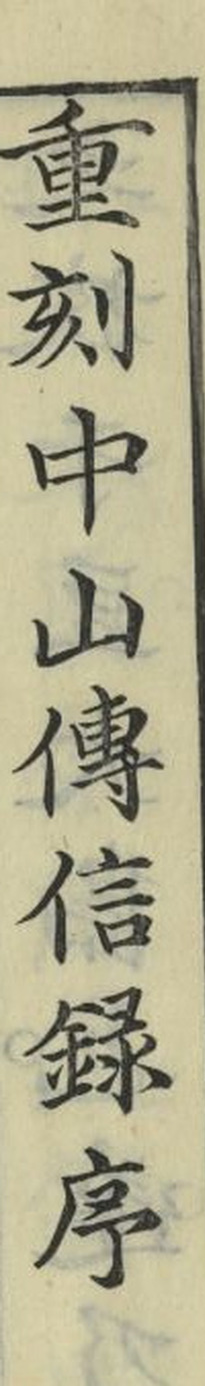重刻中山傳信録序
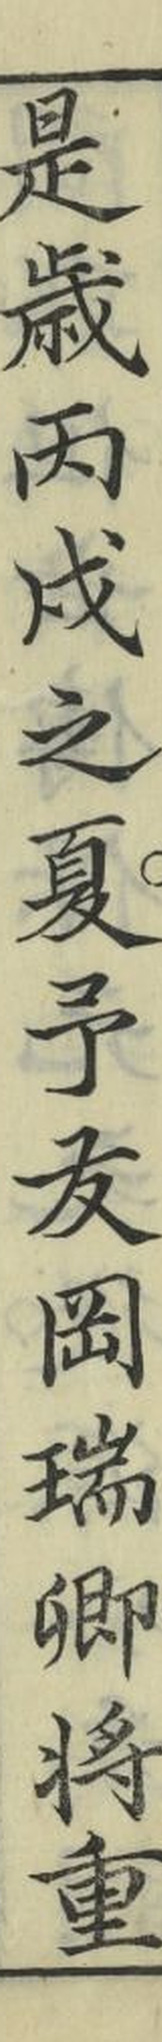是歳丙戌之夏。予友岡瑞卿将重
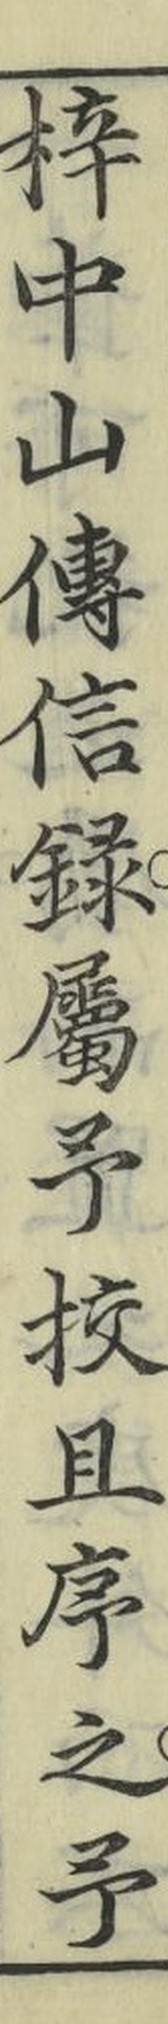梓中山傳信録。屬予挍且序之。予
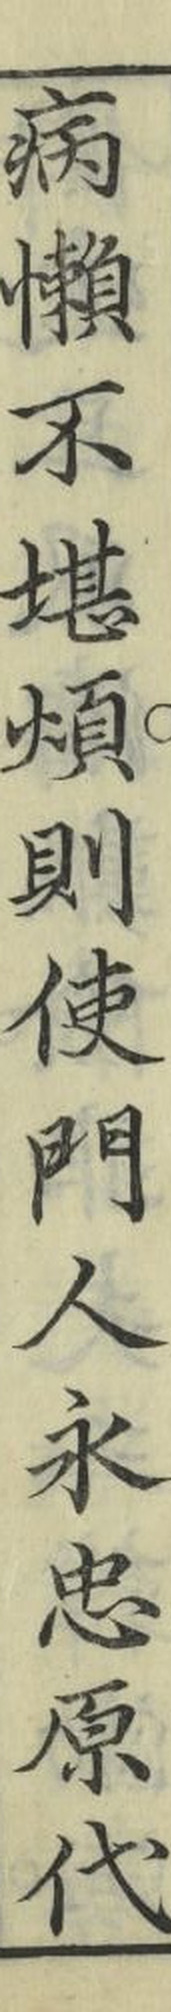病懶不堪煩。則使門人永忠原代
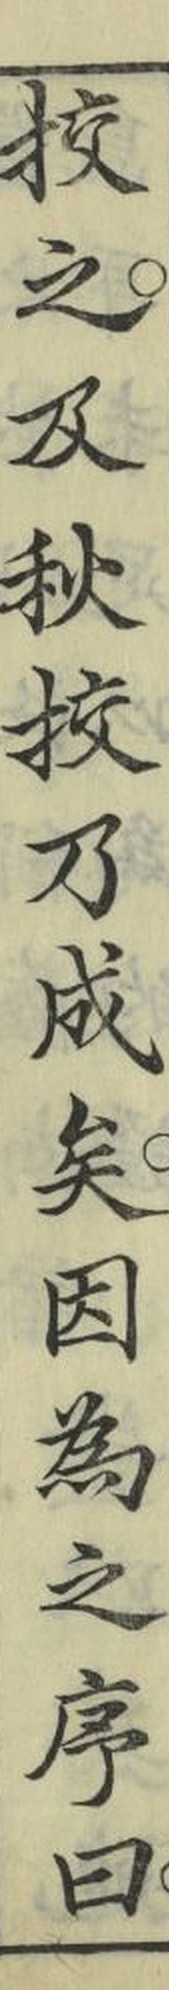挍之。及秋挍乃成矣。因為之序曰。
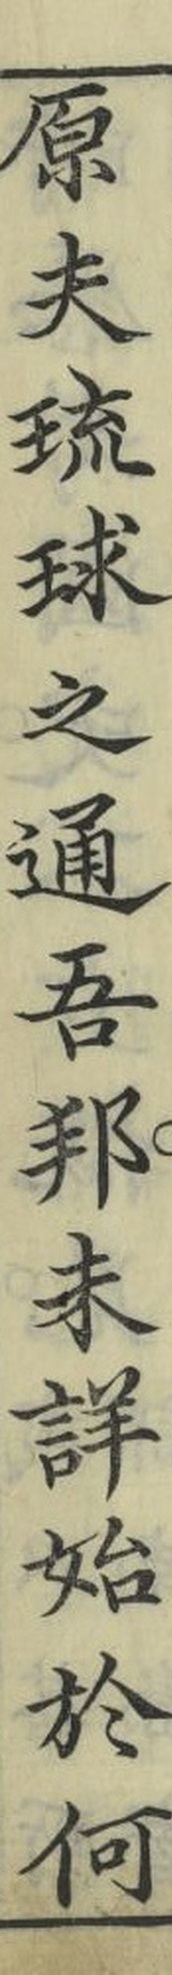原夫琉球之通吾邦。未詳始於何

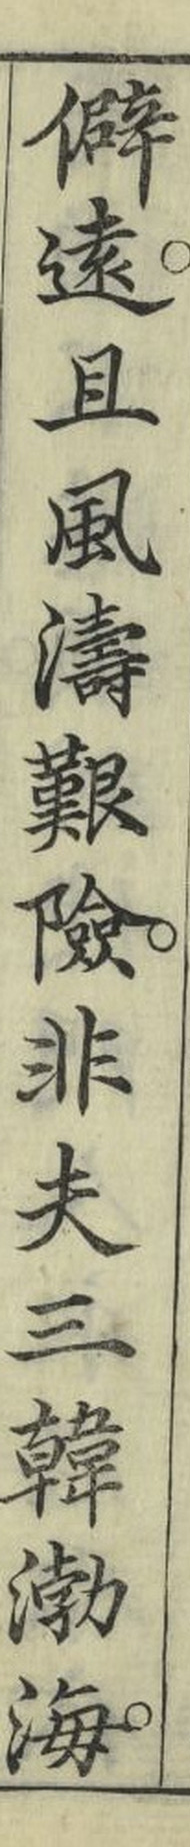僻逺。且風濤艱險。非夫三韓渤海。
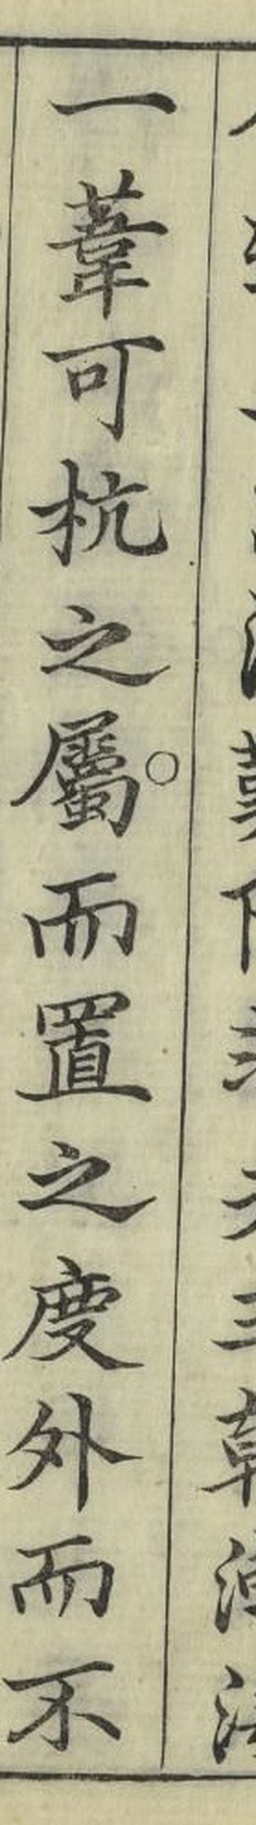一葦可杭之屬。而置之度外而不
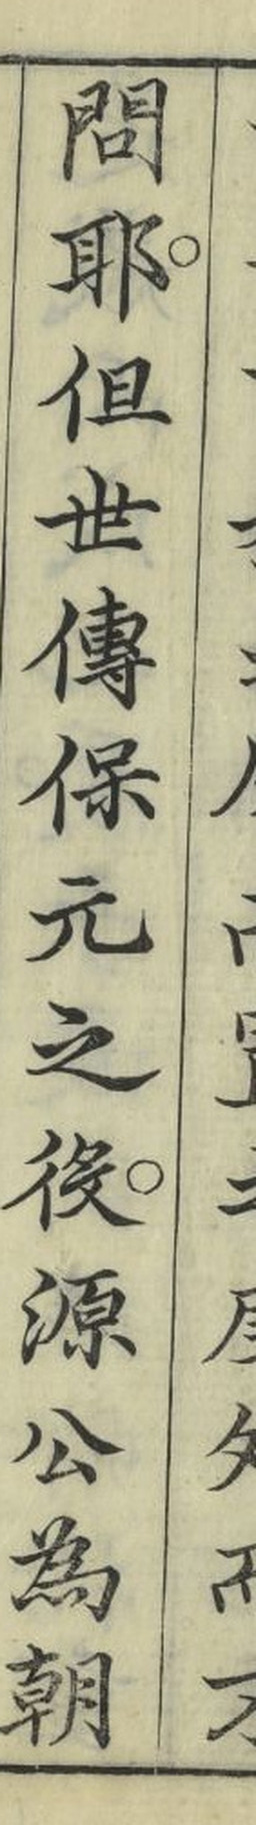問耶。但世傳保元之役。源公為朝
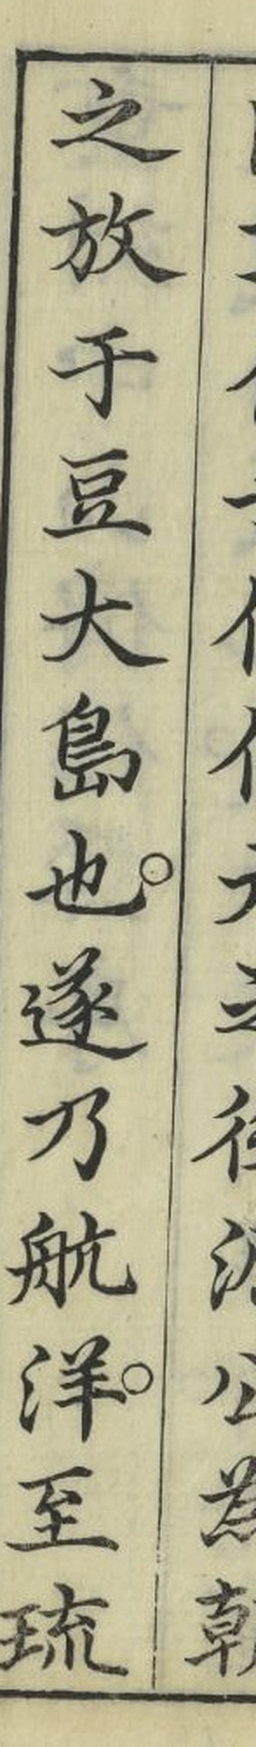之放于豆大島也。遂乃航洋。至琉
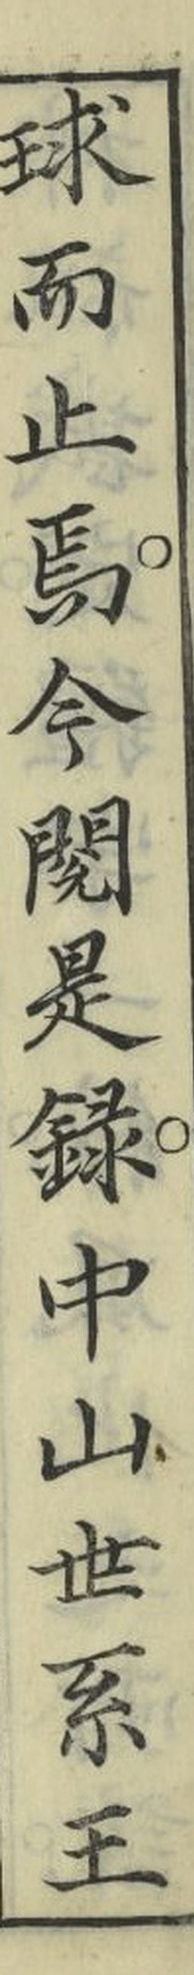球而止焉。今閱是録。中山世系王
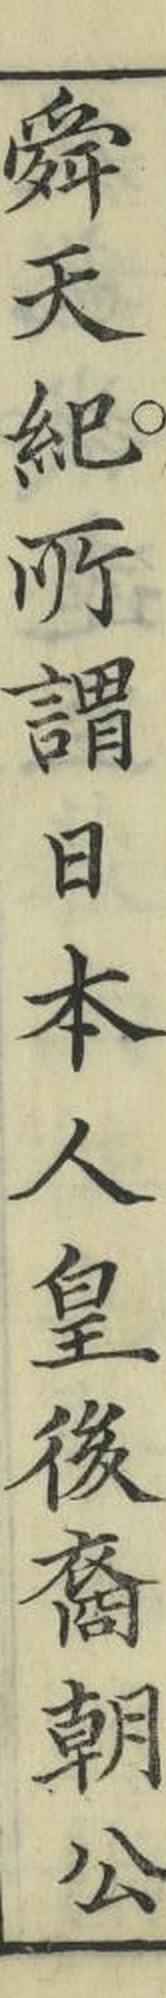舜天紀。所謂日本人皇後裔朝公
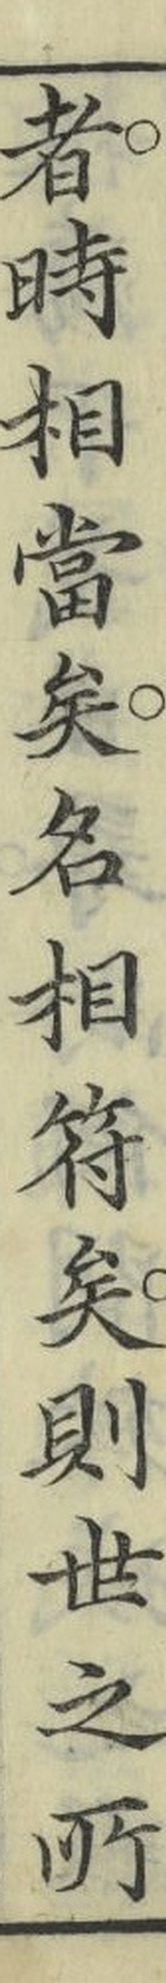者。時相當矣。名相符矣。則世之所
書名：中山伝信録 巻一
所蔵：University of the Ryukyus Library
